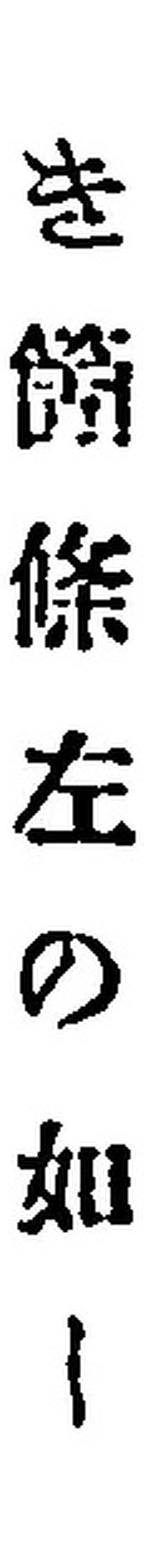き箇条左の如し
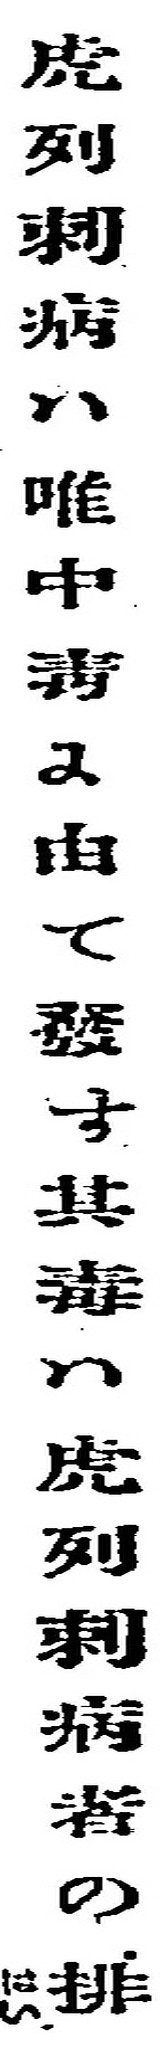虎列刺病は唯中毒に由て発す其毒は虎列刺病者の排
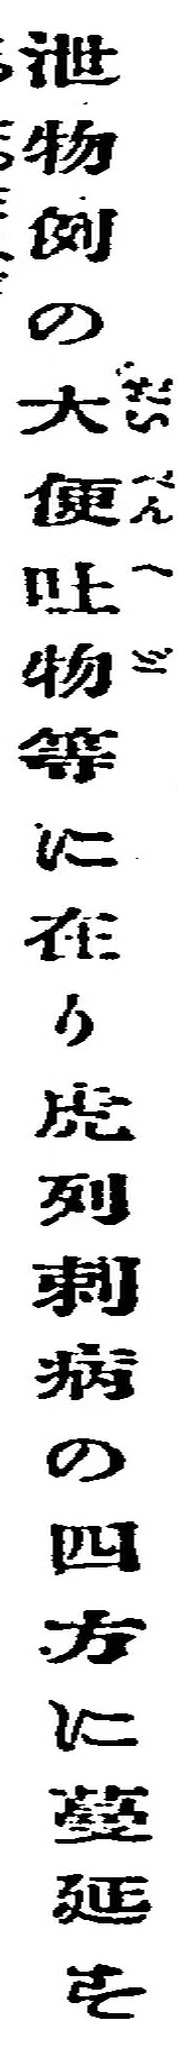泄物例の大便吐物等に在り虎列刺病の四方に蔓延す
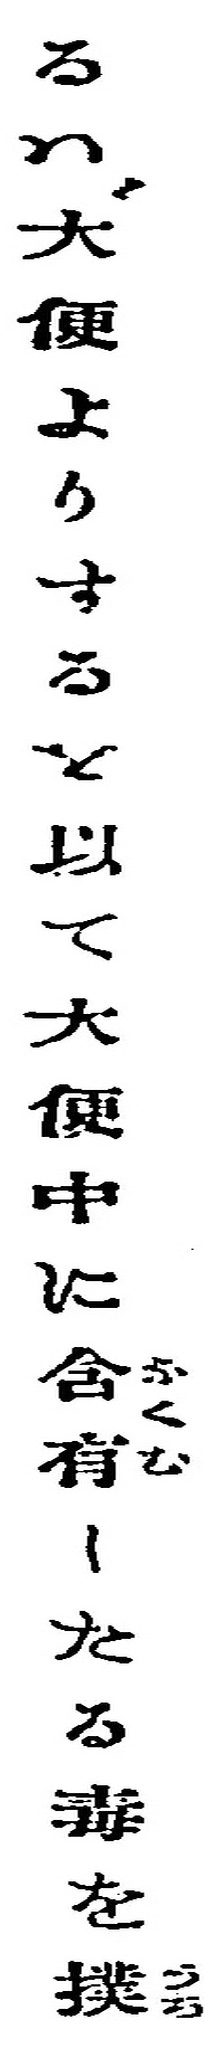るは大便よりするを以て大便中に含有したる毒を撲
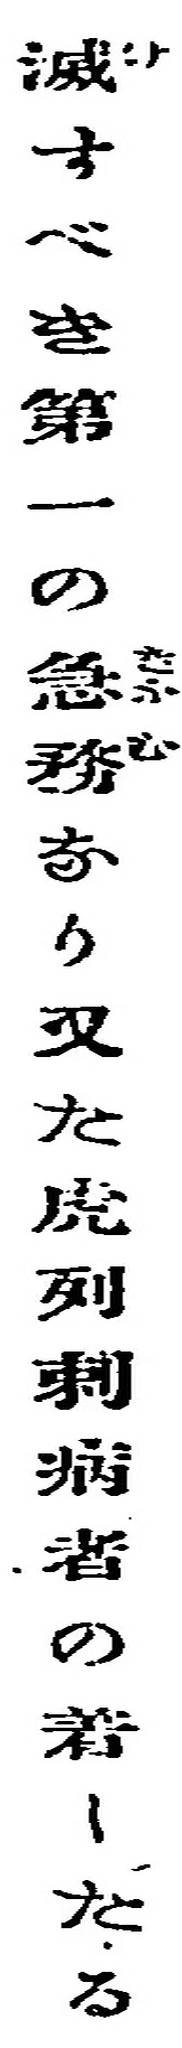滅すべき第一の急務なり又た虎列刺病者の着したる
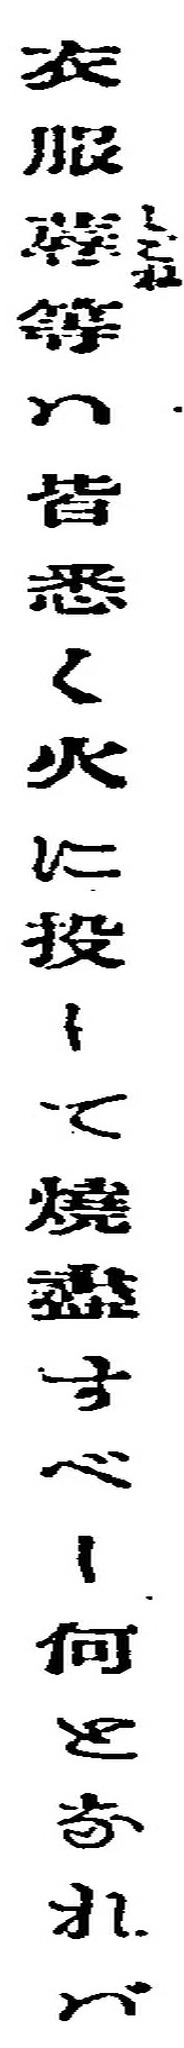衣服蓐等は皆悉く火に投して焼尽すべし何となれば
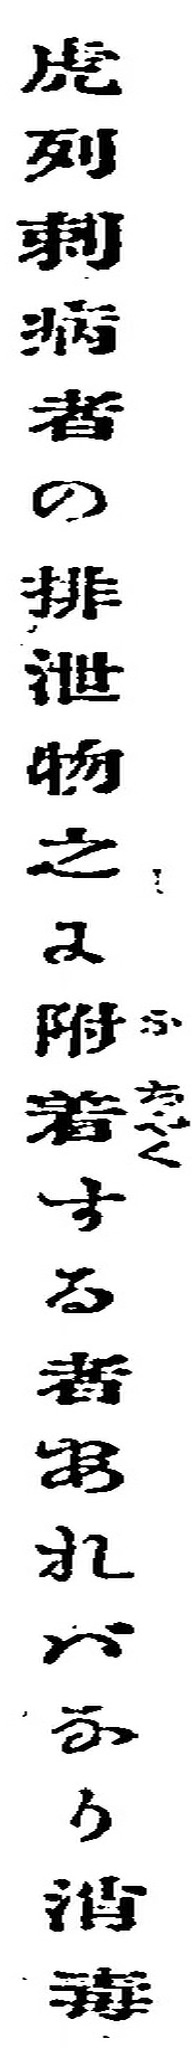虎列刺病者の排泄物之に附着する者あればなり消毒
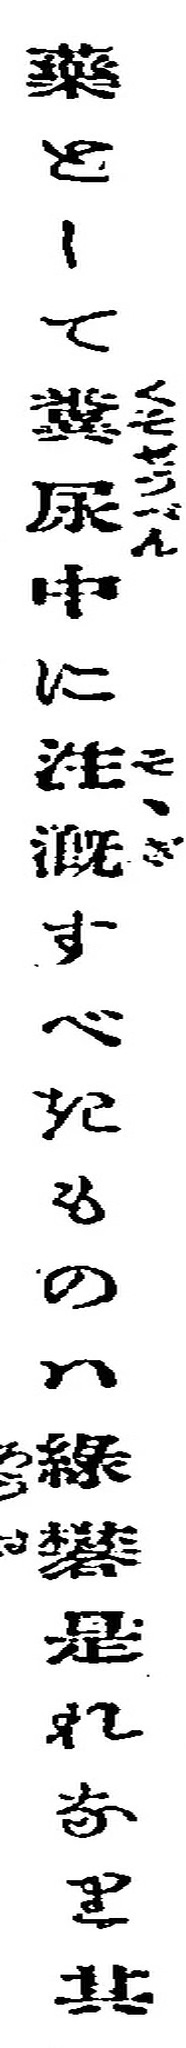薬として糞尿中に注漑すべきものは緑礬是れなり其
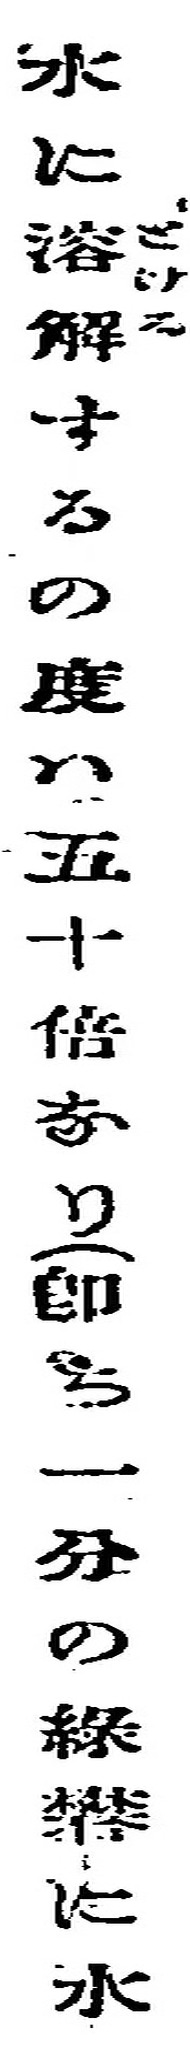水に溶解するの度は五十倍なり(即ち一分の緑礬に水

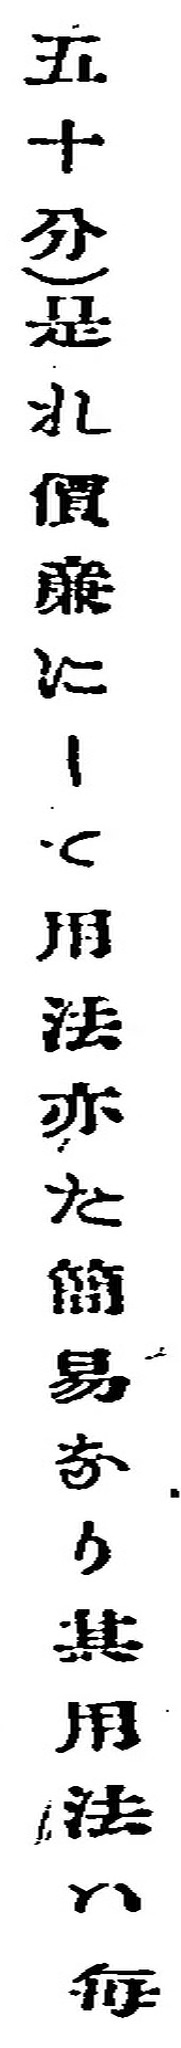五十分)是れ価廉にして用法亦た簡易なり其用法は毎
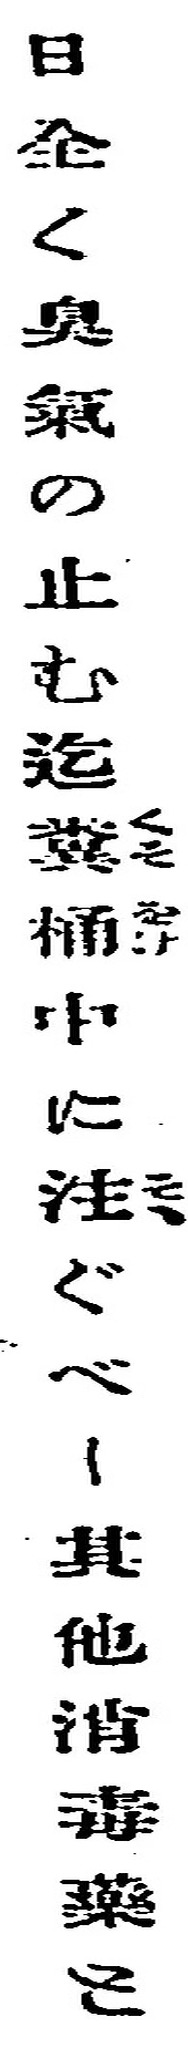日全く臭気の止む迄糞桶中に注ぐべし其他消毒薬と
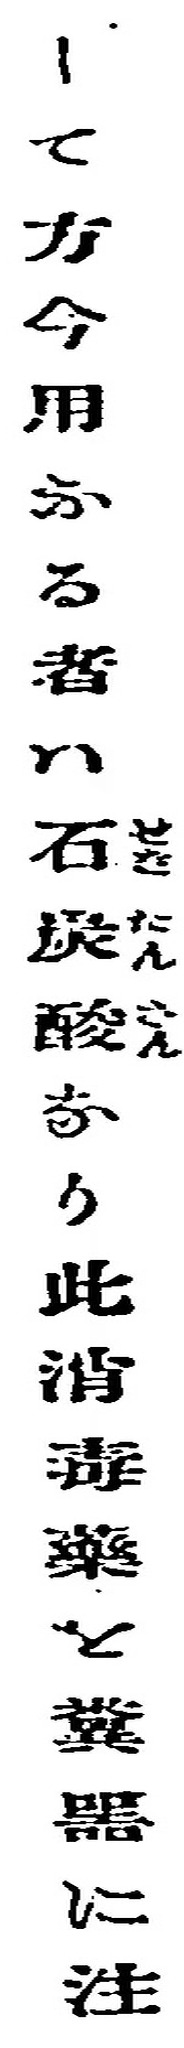して方今用ふる者は石炭酸なり此消毒薬を糞器に注
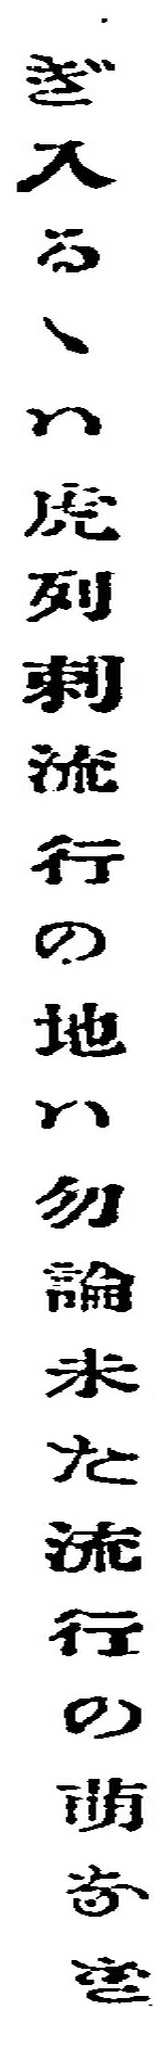ぎ入るゝは虎列刺流行の地は勿論未た流行の萌なき
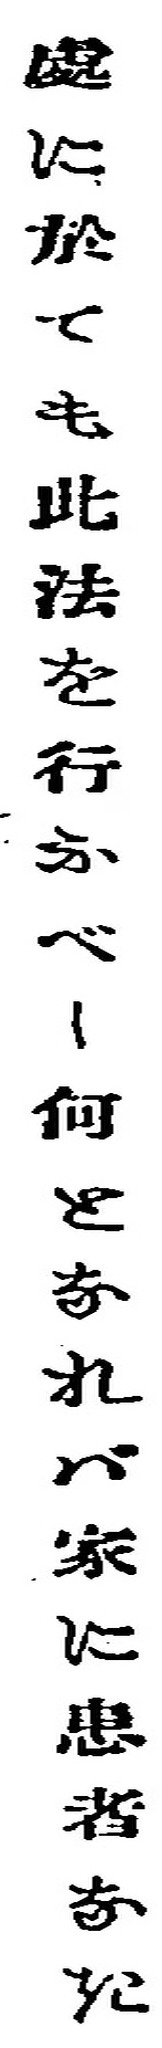処に於ても此法を行ふべし何となれば家に患者なき
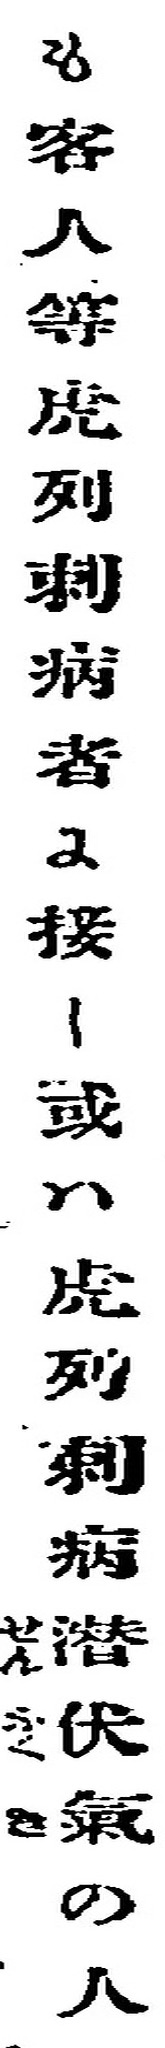も客人等虎列刺病者に接し或は虎列刺病潜伏気の人
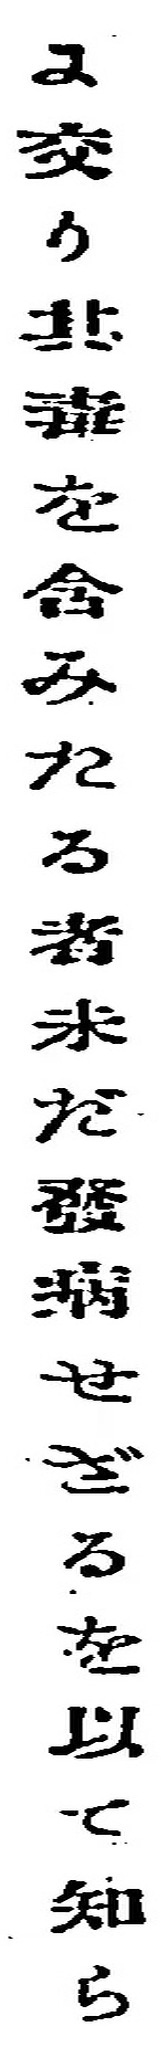に交り其毒を含みたる者未だ発病せざるを以て知ら
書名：これら病予防心得
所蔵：国立国会図書館 National Diet Library, JAPAN
